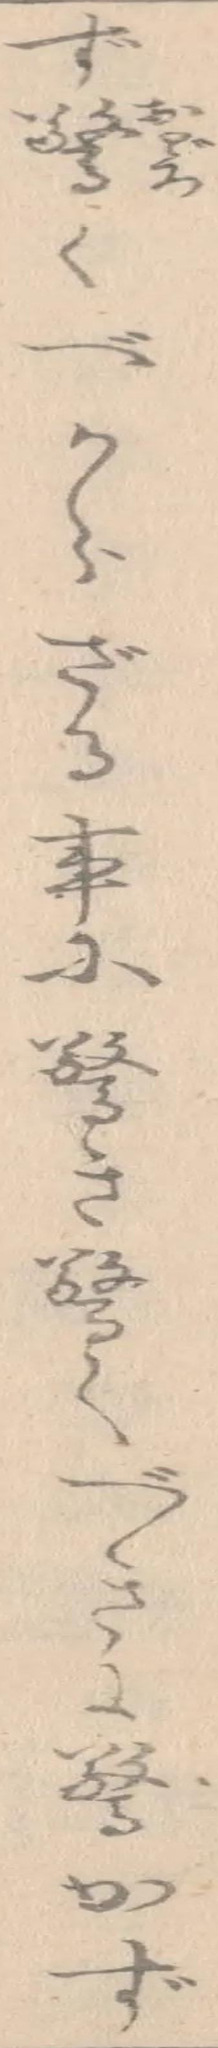ず驚くべからざる事に驚き驚くべきに驚かず
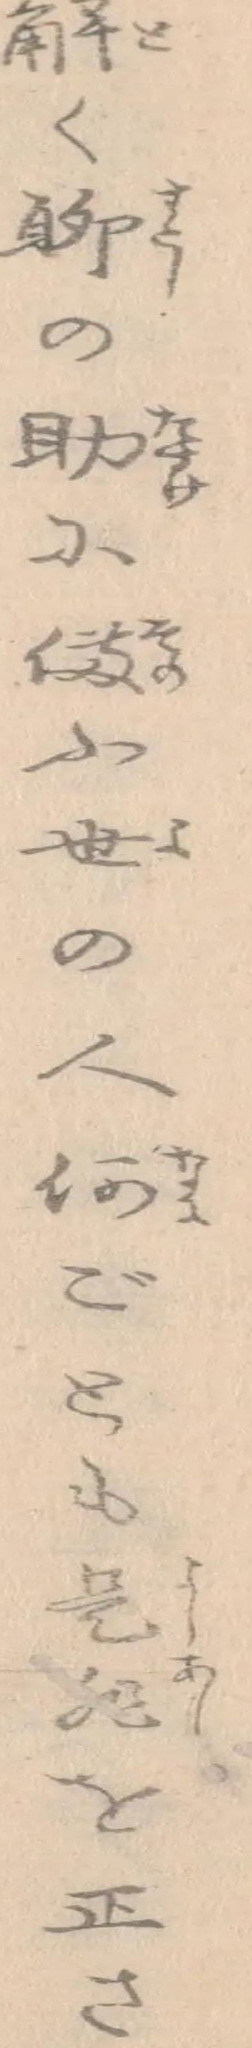解く聊の助に備ふ世のひと何ごとも是非を正さ
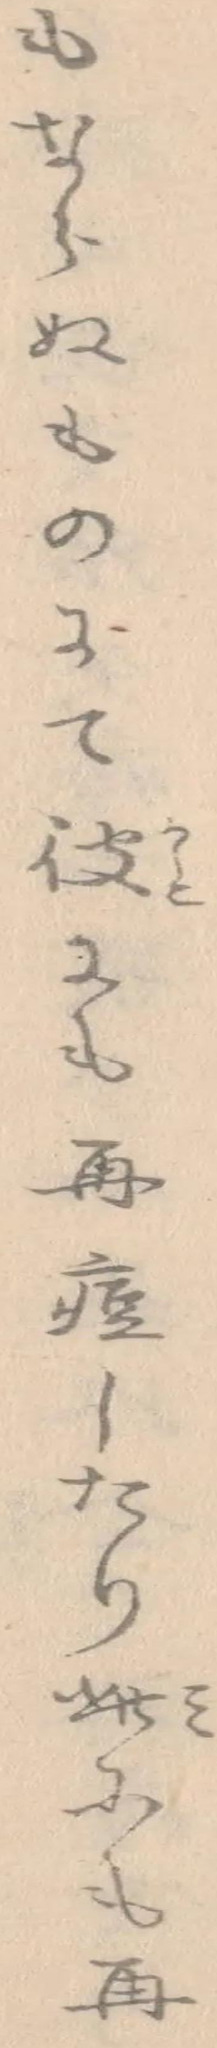もならぬものにて彼にも再痘したりにも再
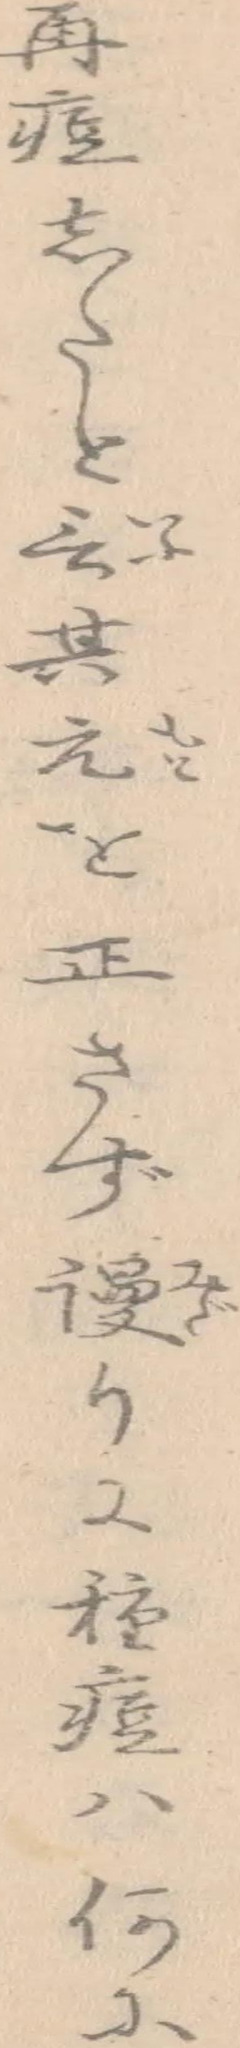再痘したと言其元を正さず漫りに種痘は何に
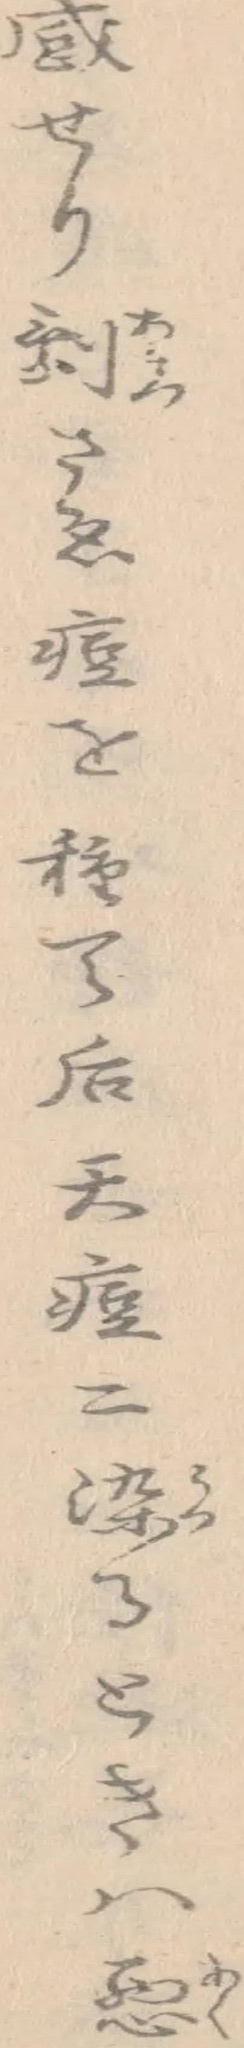感せり剩さゑ痘を種て后天痘に染るときは悪
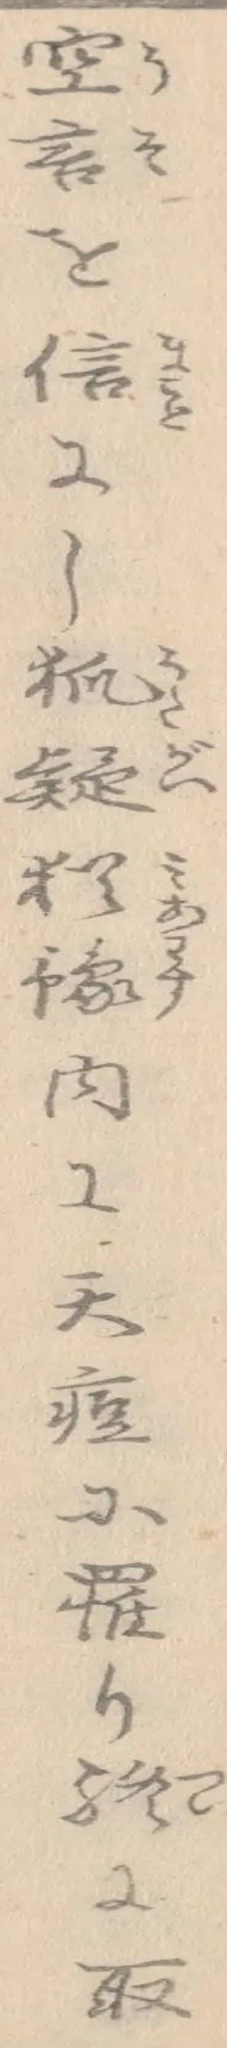空言を信にし狐疑猶予内に天痘に罹り終に取
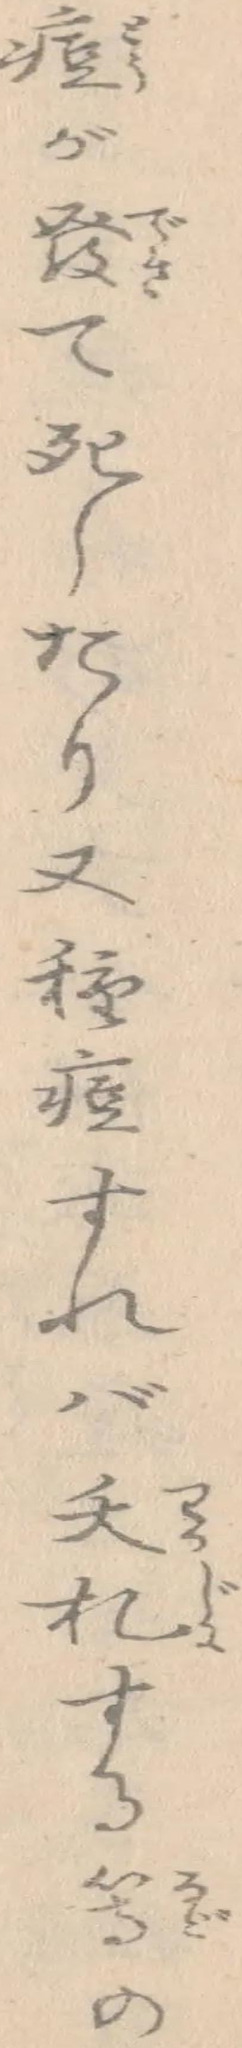痘が発て死したり又種痘すれば夭折する等の
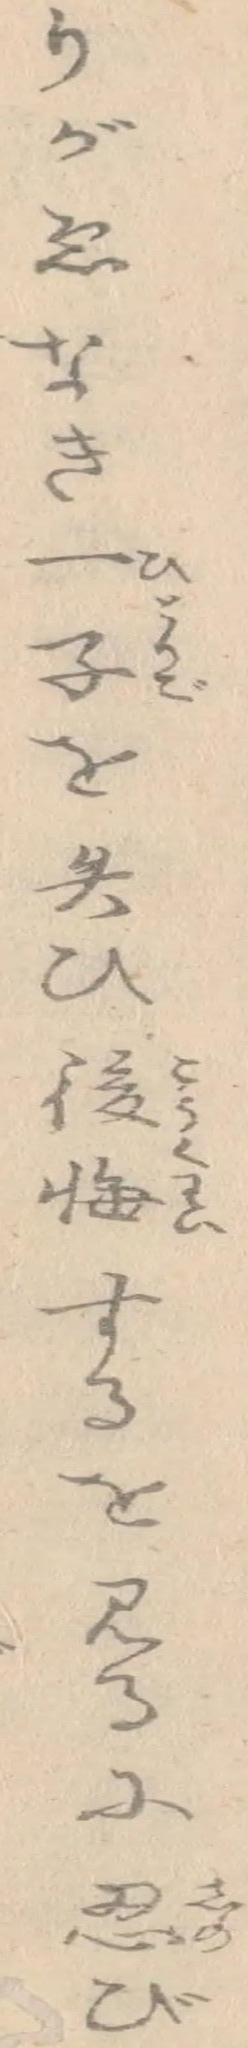りがゑなき一子を失ひ後悔するを見るに忍び
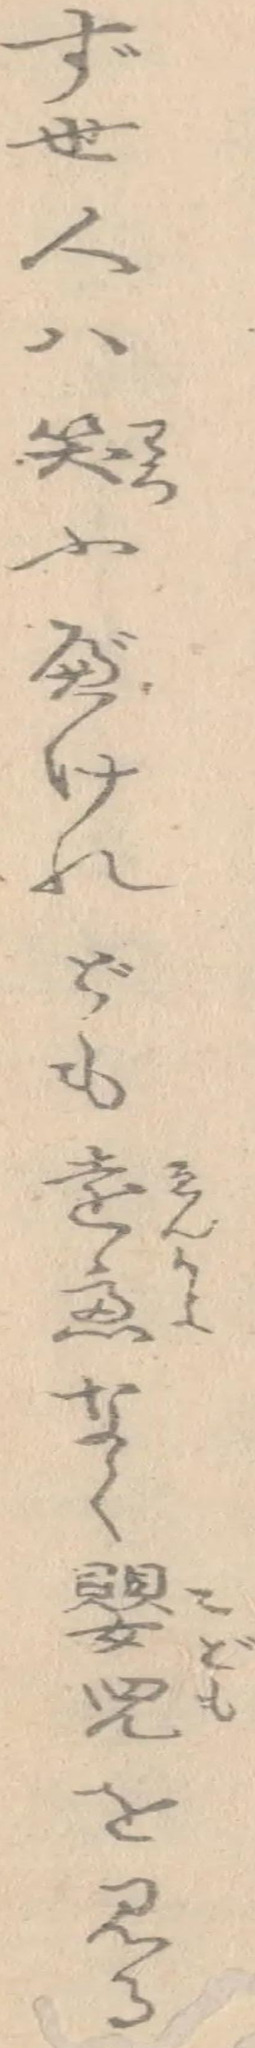ず世人は笑ふべけれども遠慮なく嬰児を見る

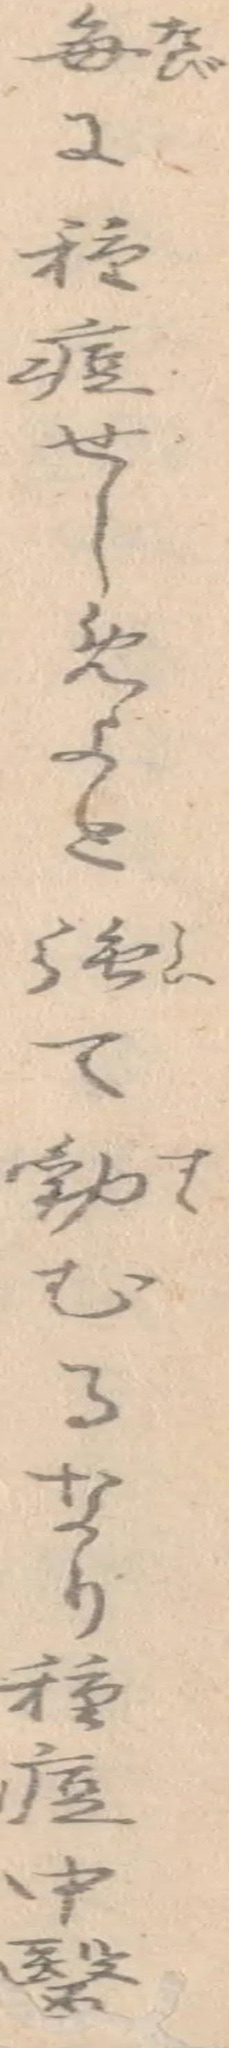毎に種痘せしめよと強て勧むなり種痘中醫
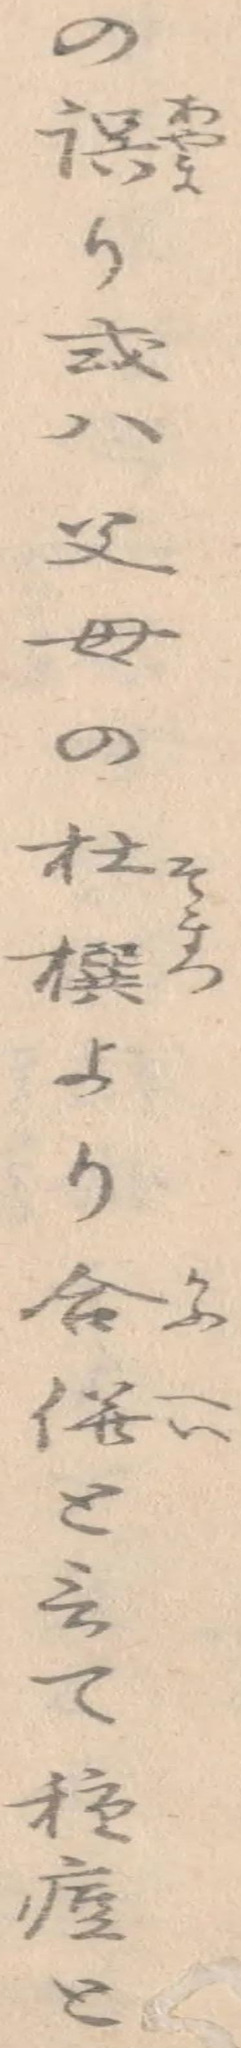の誤り或は父母の杜撰より合併と言て種痘と
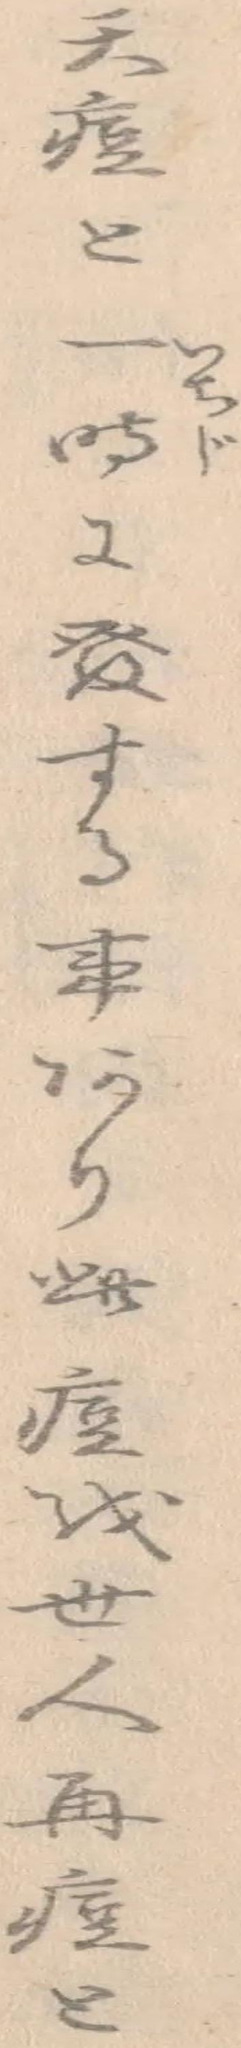天痘と一時に発する事なり此痘を世人再痘と
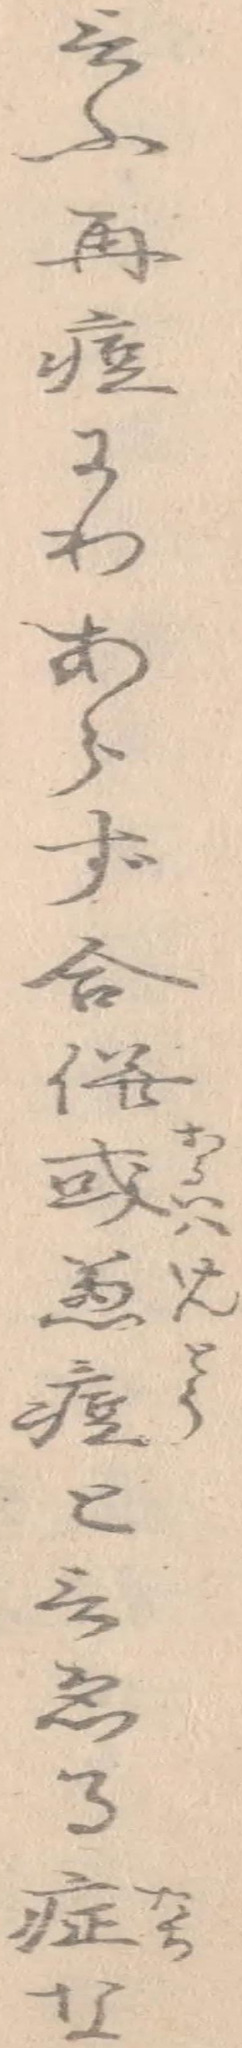言ふ再痘にわあらず合併或兼痘と言ゑる症な
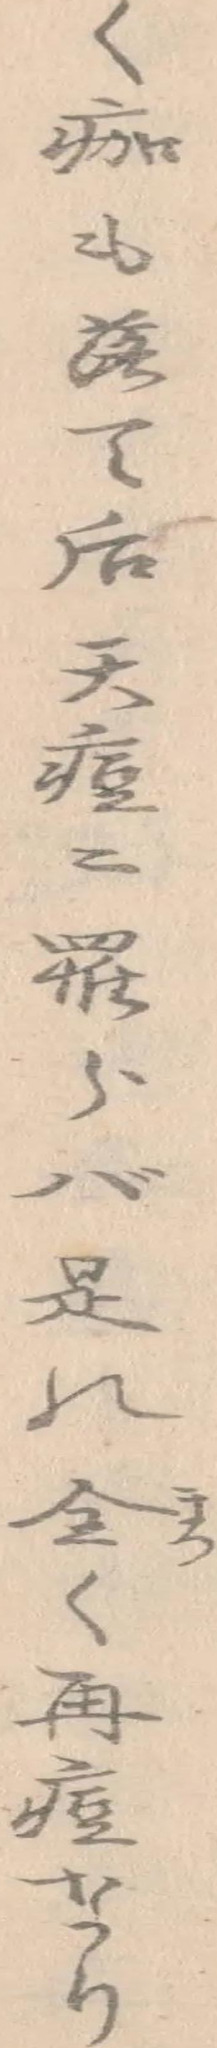く痂も落て后天痘に罹らば是れ全く再痘なり
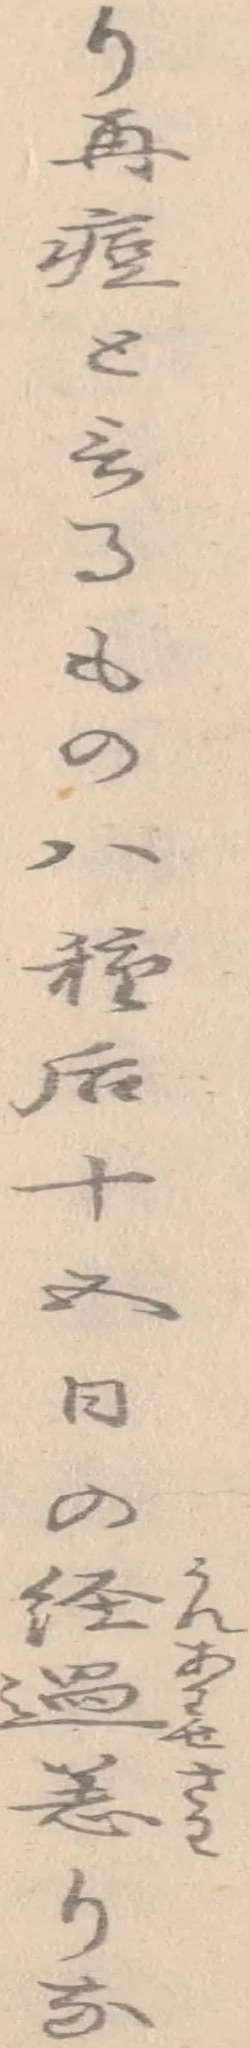り再痘と言るものは種后十五日の経過恙りな
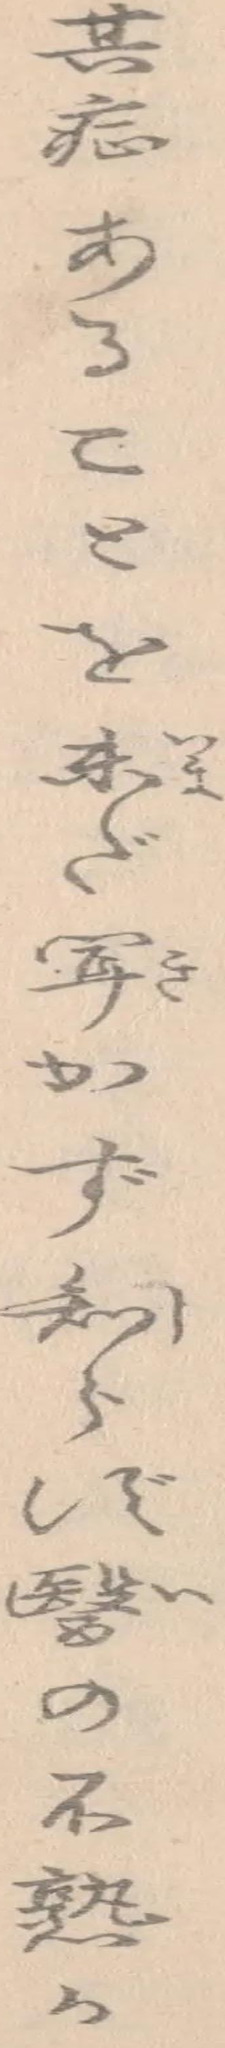其症あることを未だ聞かず知らず醫の不熟か
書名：散花養生訓
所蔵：国立国会図書館 National Diet Library, JAPAN
